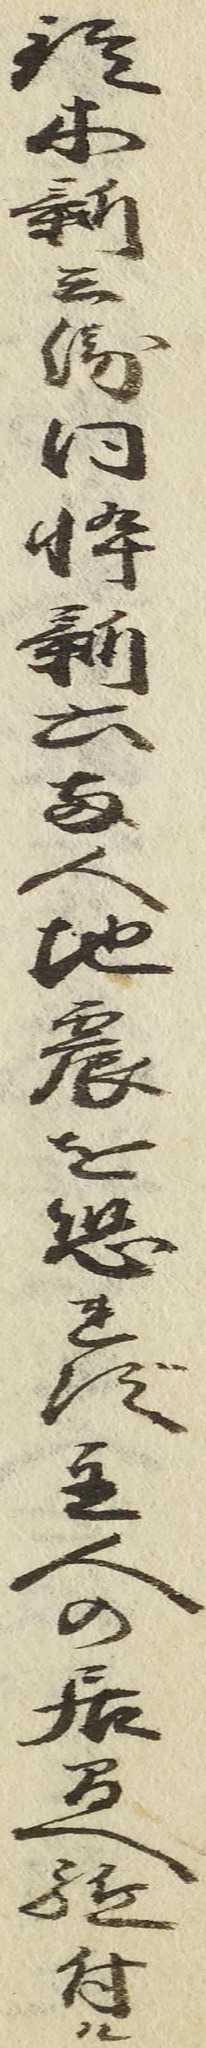鈴木新兵衛同悴新六両人地震を恐れず主人の居間へ駈付ル
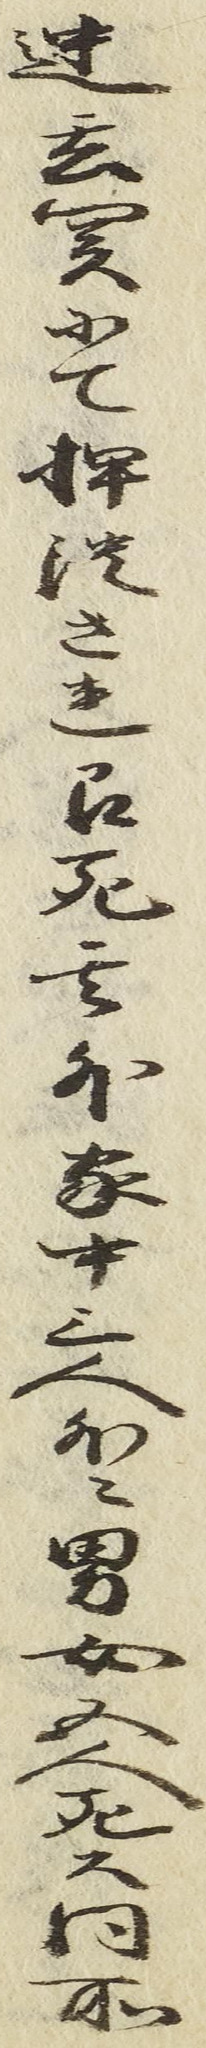迚玄関にて押潰され即死其外家中三人外ニ男女五人死ス同所
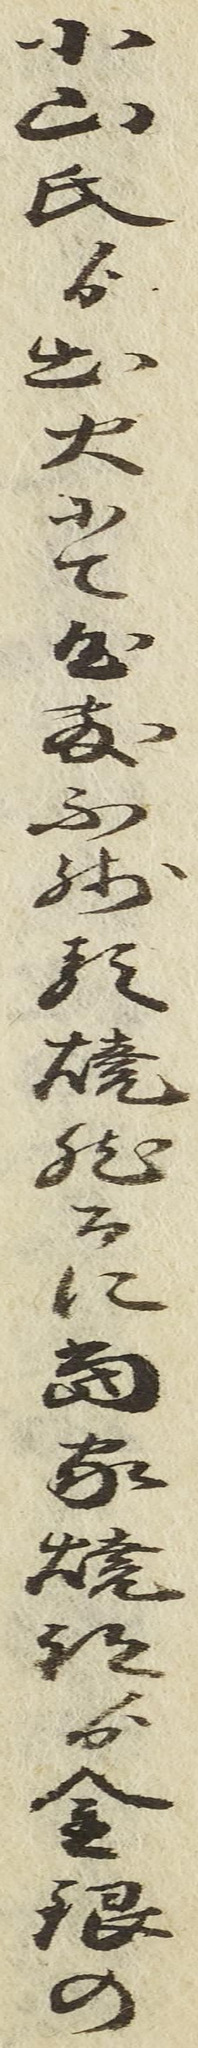小山氏ゟ出火にて屋敷不残類焼然るに当家焼跡ゟ金銀の
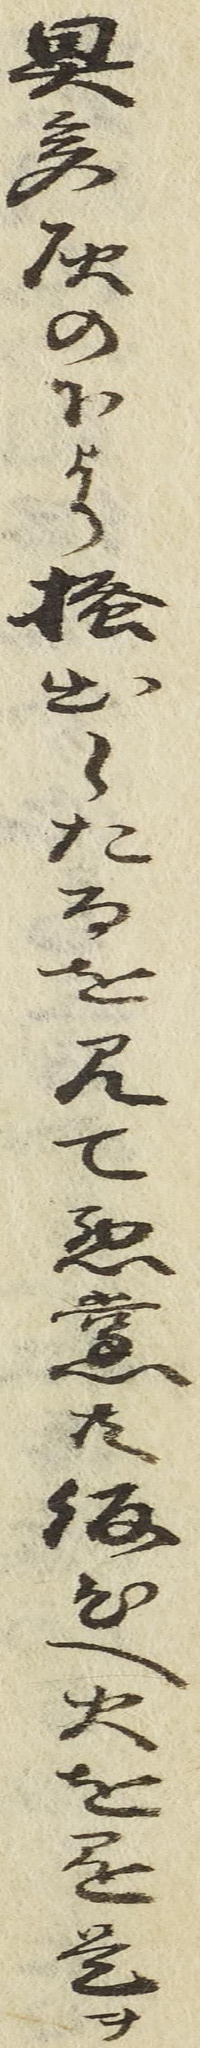具多灰の下より掻出したるを見て悪党共仮屋へ火を懸是ヲ
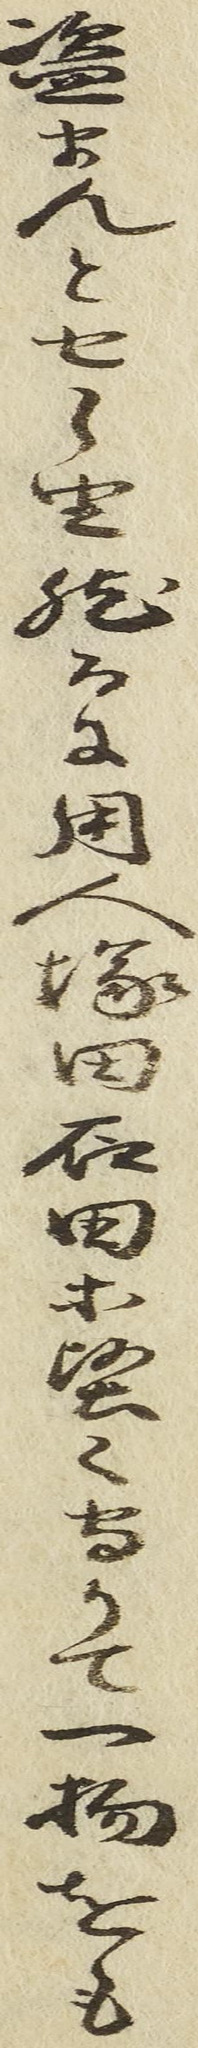盗まんとセし由然るに用人塚田石田等堅く守りて一物をも

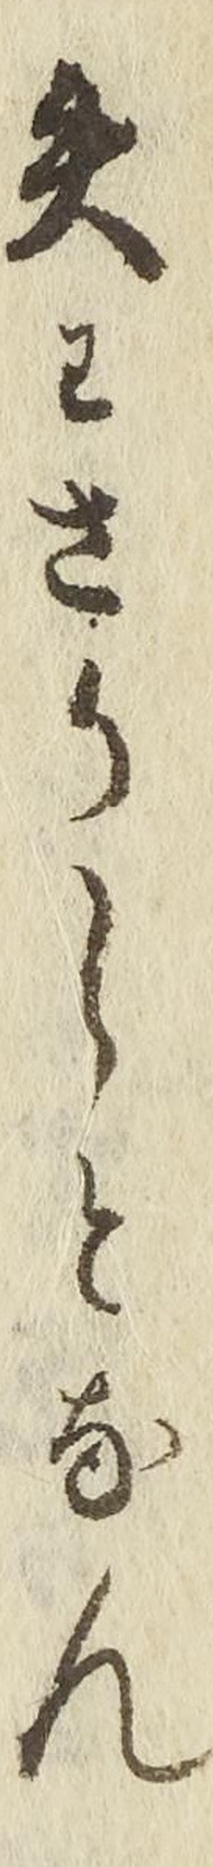失わさりしとなん
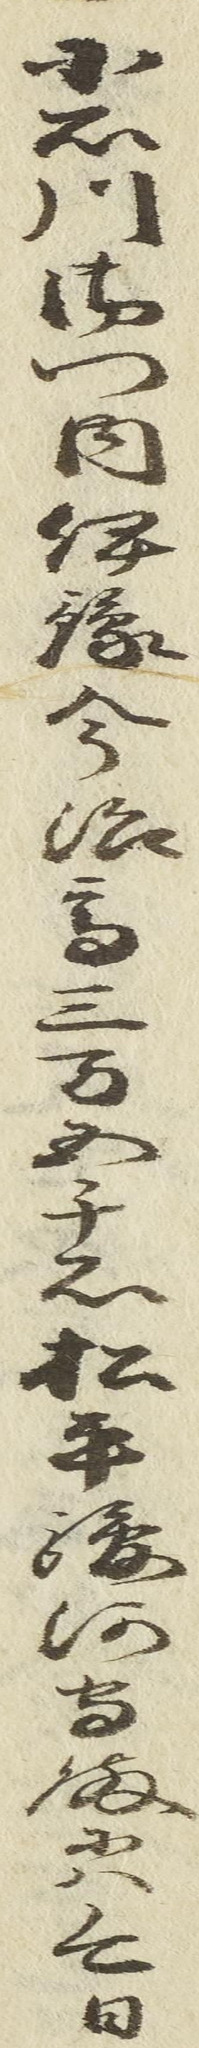○小石川御門内伊予今治高三万五千石松平駿河守殿には今日
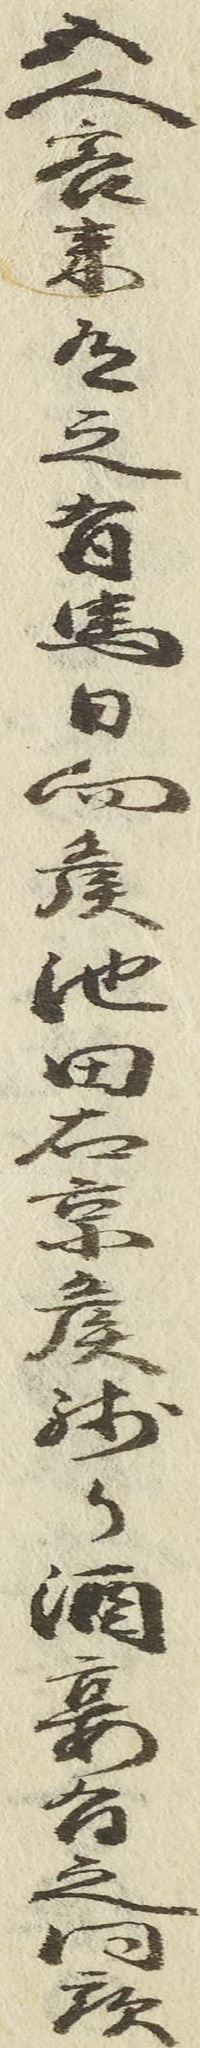五人客来有之有馬日向侯池田右京侯残り酒宴有之同夜
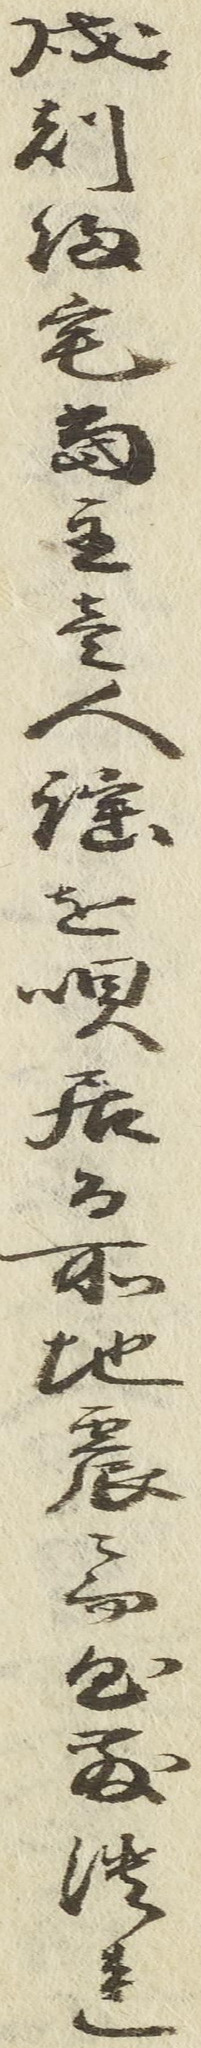戌刻帰宅当主壱人謡を唄居る所地震二而屋敷潰れ
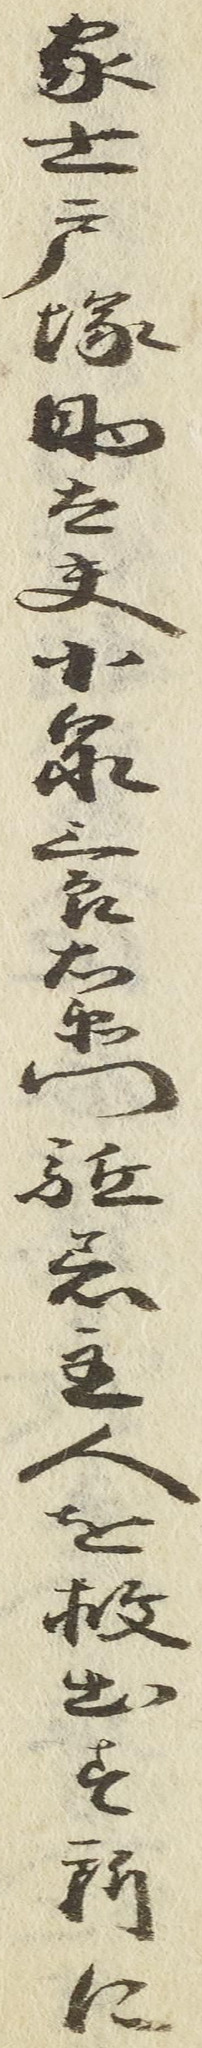家士戸塚助太夫小泉三郎右衛門駈着主人を救出す所に
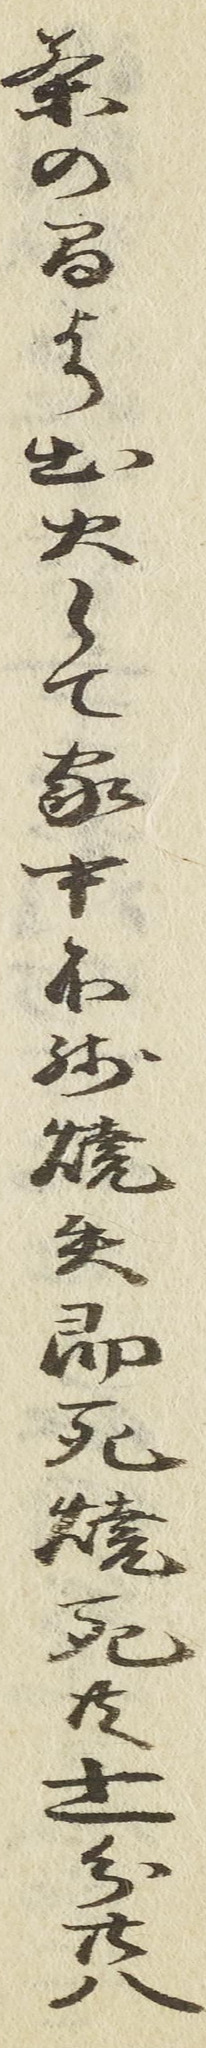茶の間より出火して家中不残焼失即死焼死共士分廿八
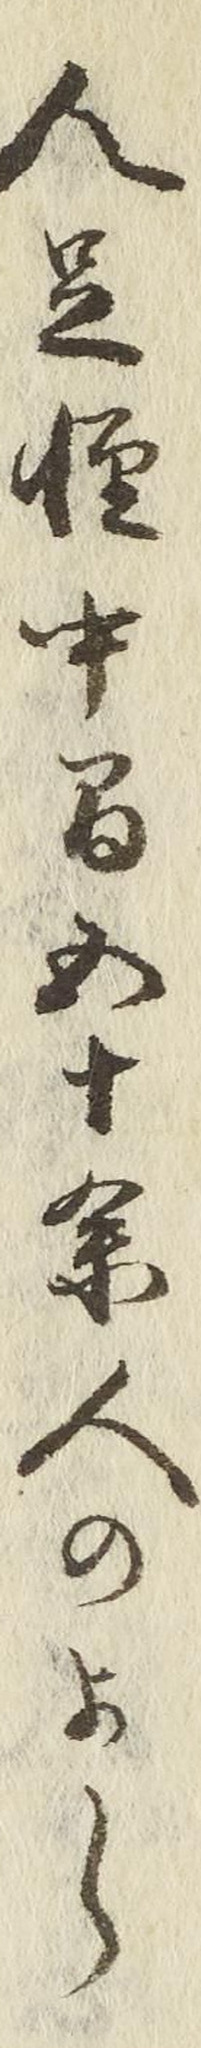人足軽中間五十余人のよし
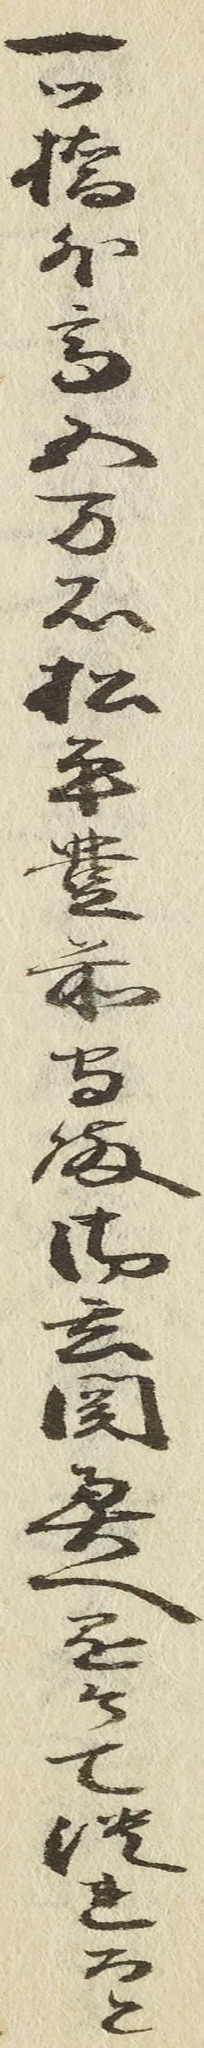○一ツ橋外高五万石松平豊前守殿御玄関奥へ懸けて潰れると
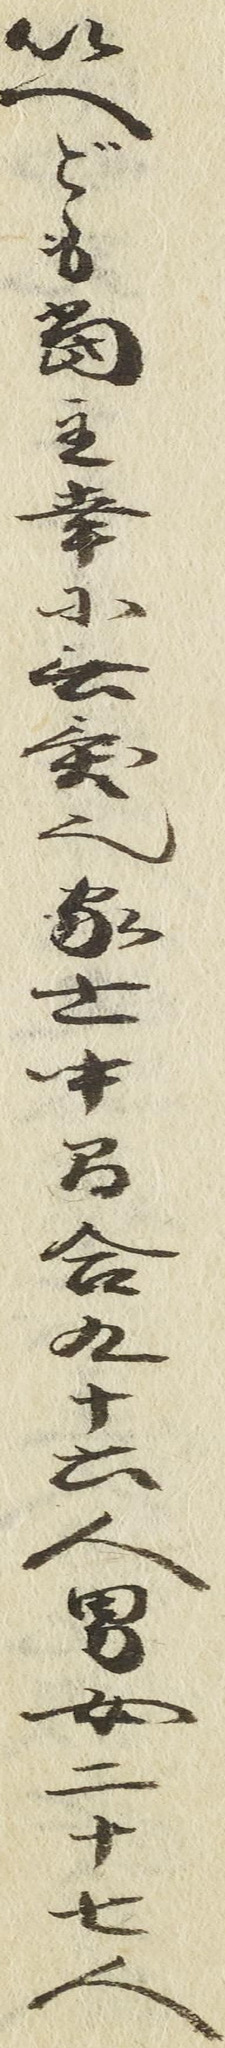いへども当主幸に無戻也家士中間合九十六人男女二十七人
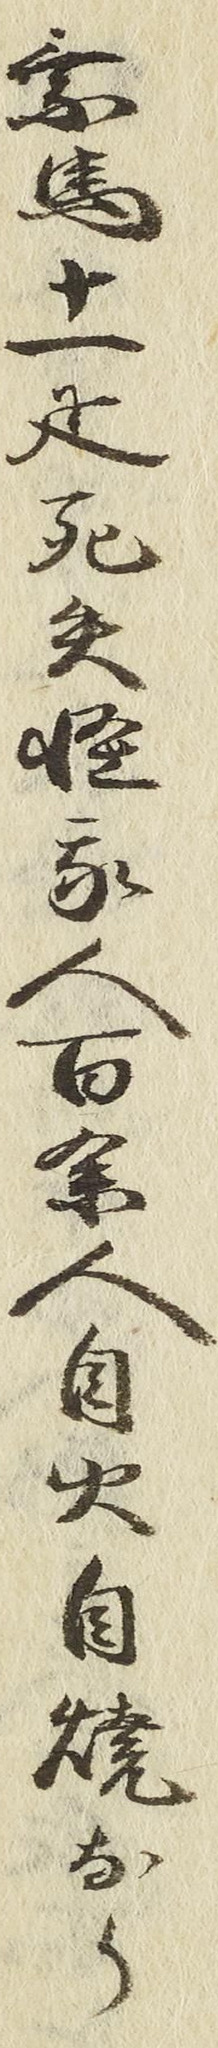乗馬十一疋死失怪我人百余人自火自焼なり
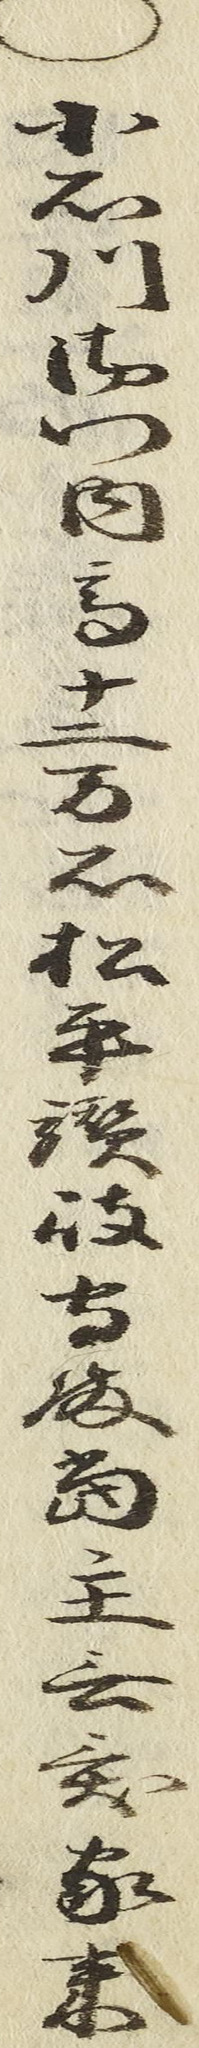○小石川御門内高十二万石松平讃岐守殿当主無戻家来
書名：安政二年震災記事　完
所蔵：東京大学地震研究所図書室 Earthquake Research Institute Library, The University of Tokyo, JAPAN
